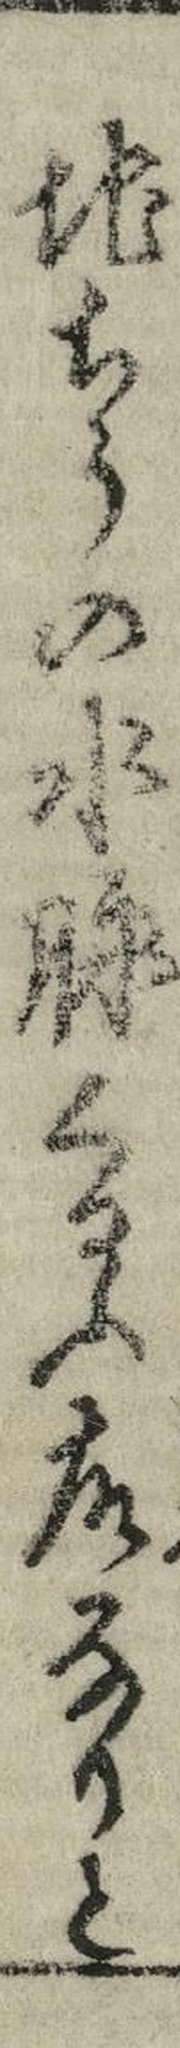地ちうの水脉くるふ故なりと
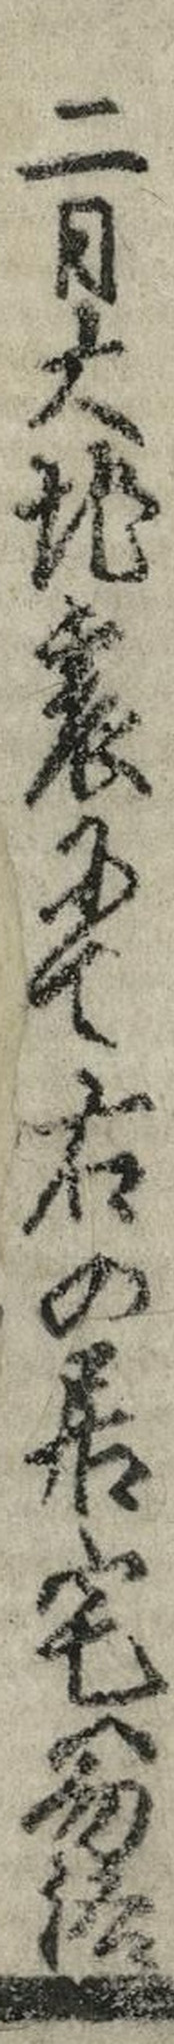二日大地震にて右の居宅へ勿論
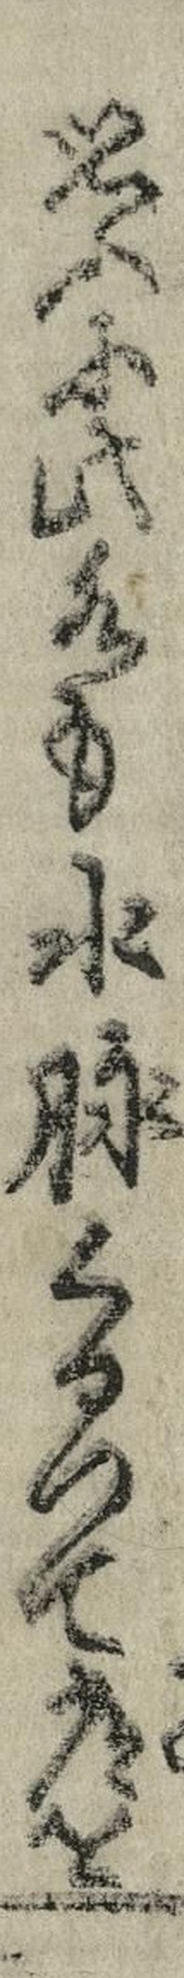思ふに此水も水脉くるつて常を
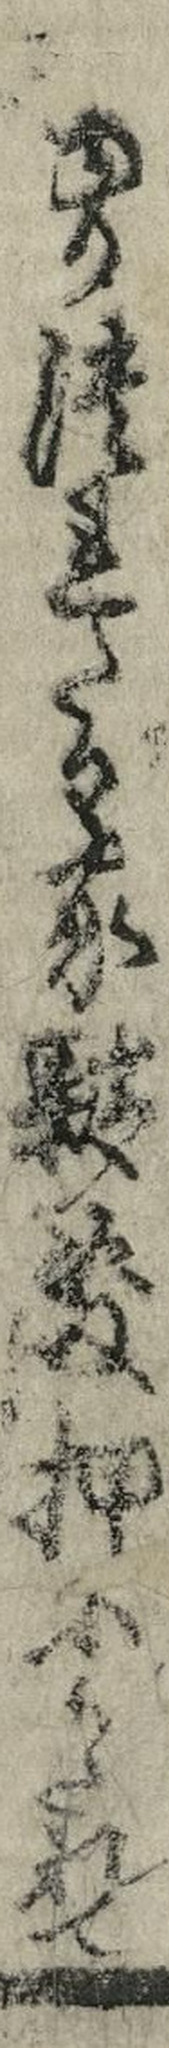ゆり潰れたる家夥敷押にうたれて
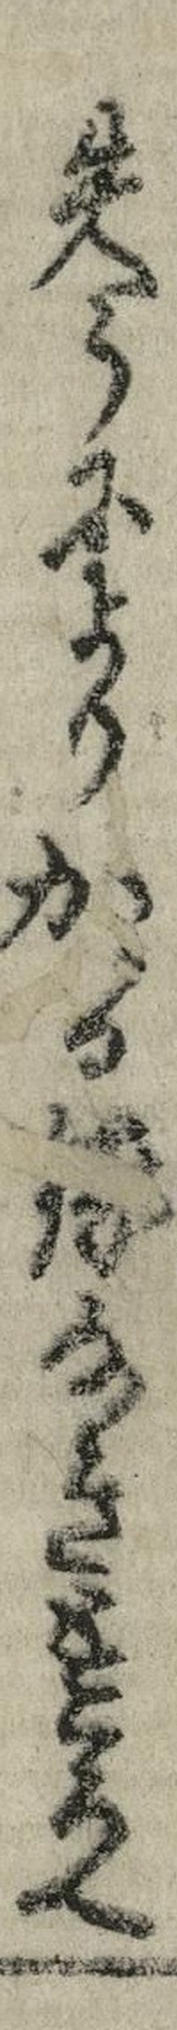失うによりかゝる縁なきところへ
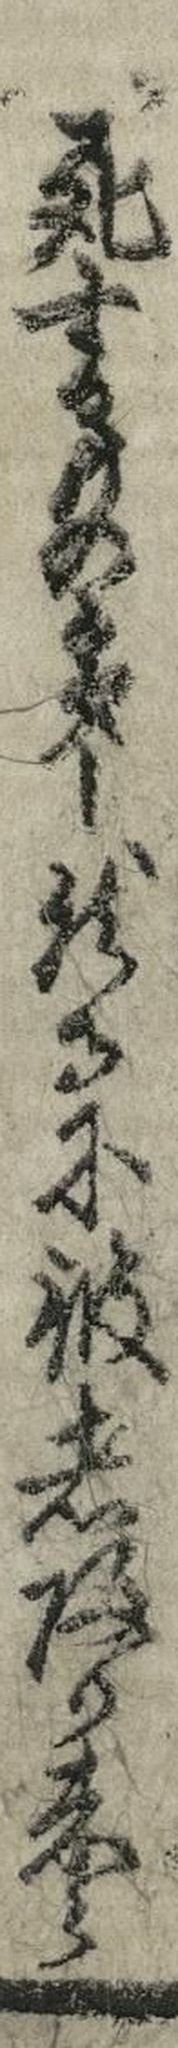死するもの多し然るに彼者帰り来ら
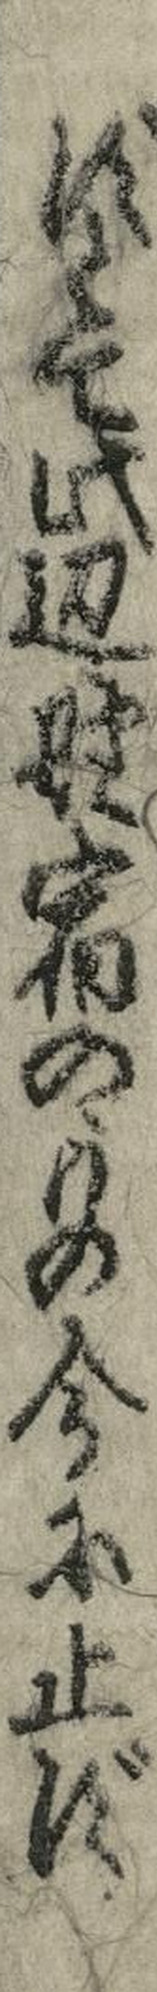ずとて此辺野宿のもの今に止ず

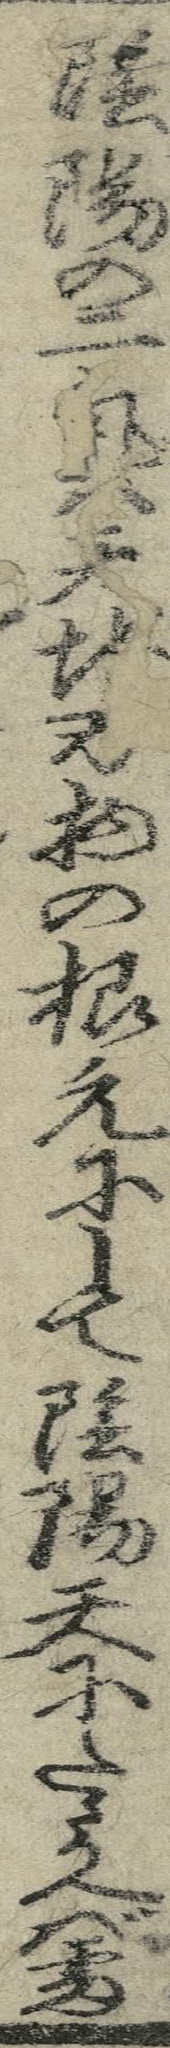陰陽の二気は天地万物の根元にして陰陽天にたゝかへば雷
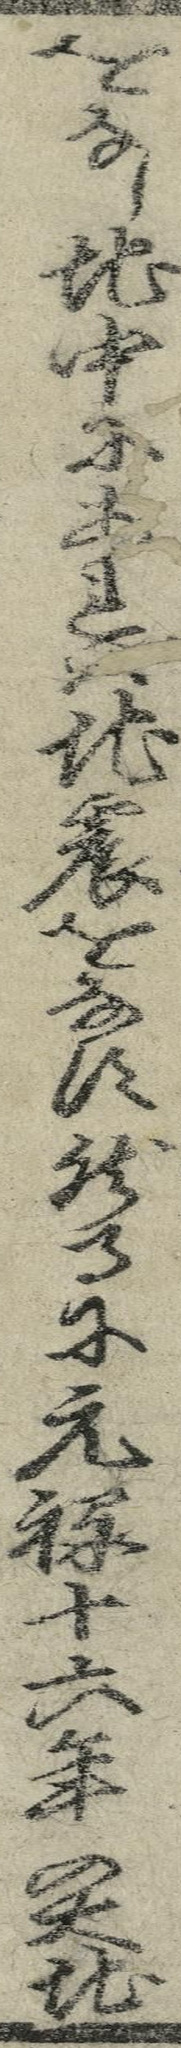をなし地中にあれは地震をなす然るに元禄十六年の大地
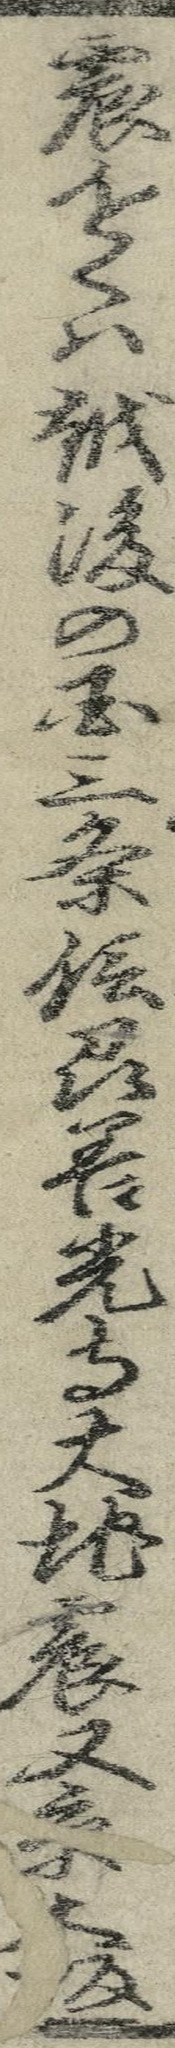震近くは越後の国三条信州善光寺大地震又京大坂
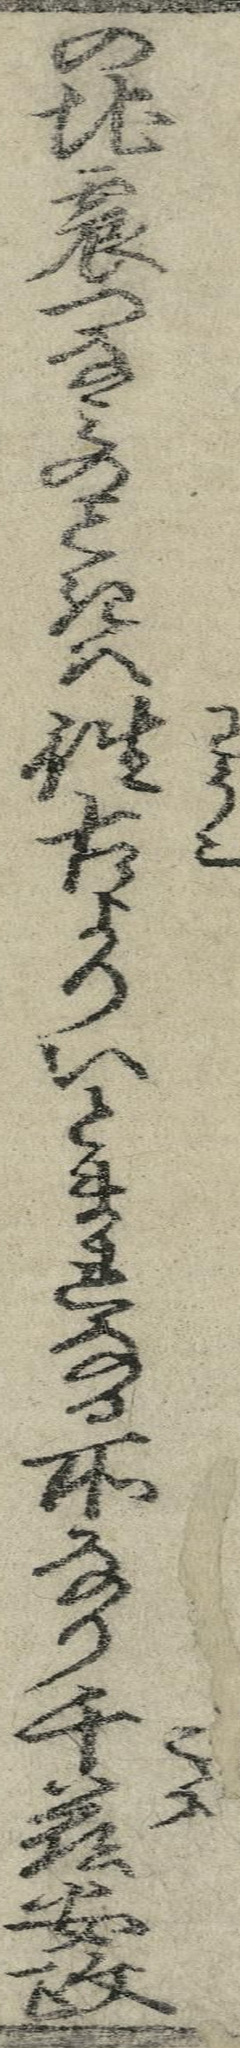の地震つなみのこときは往古よりいとまれなる所なり于茲安政
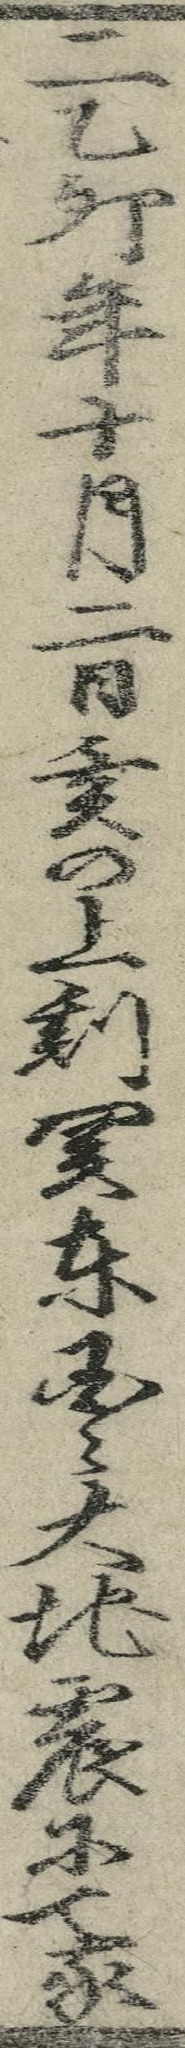二乙卯年十月二日亥の上刻関東国々大地震にて家
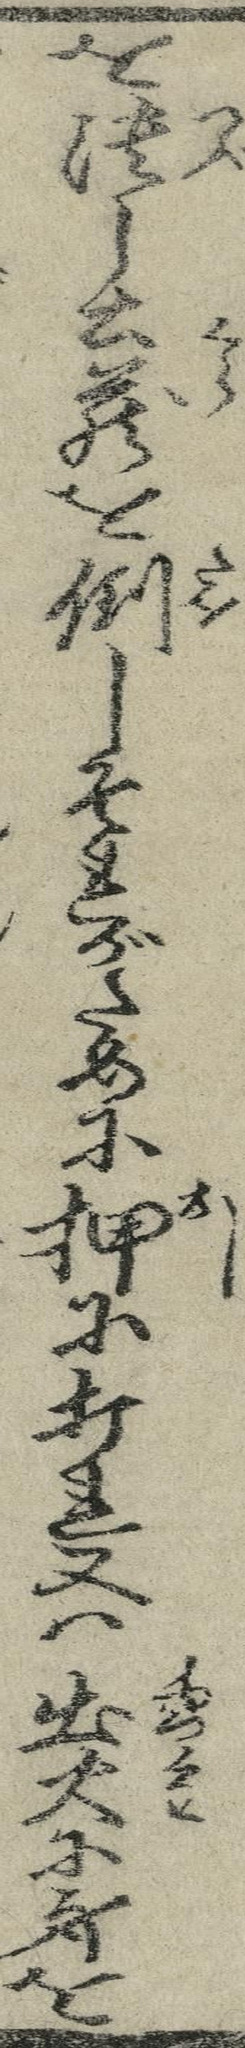を潰し土蔵を倒しそれがために押に打れ又は出火に身を
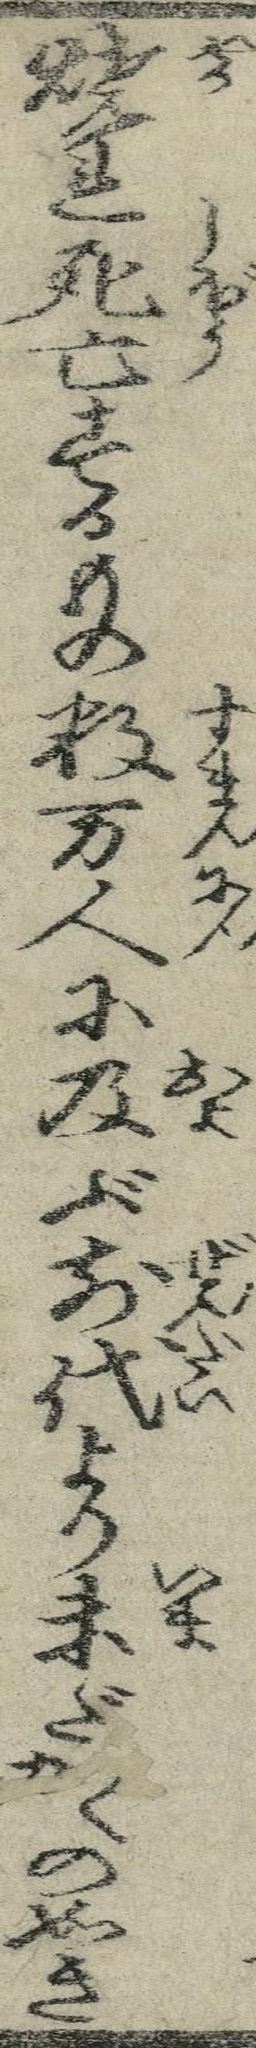焼れ死亡するもの数万人に及ぶ前代より未だかくの如き
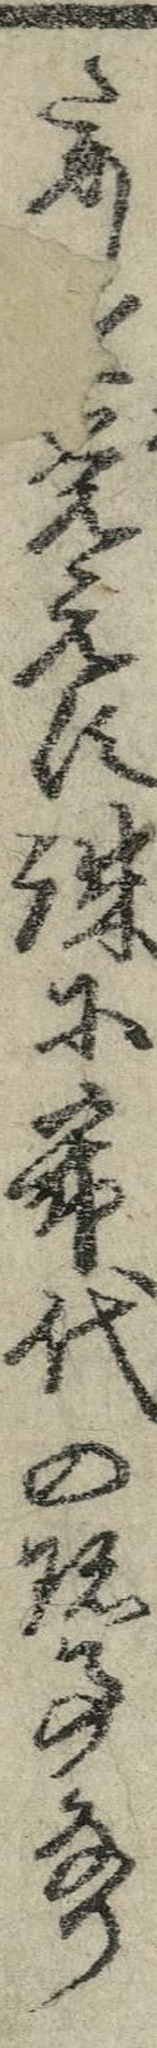ためしを？覚えす誠に希代の珍事なり
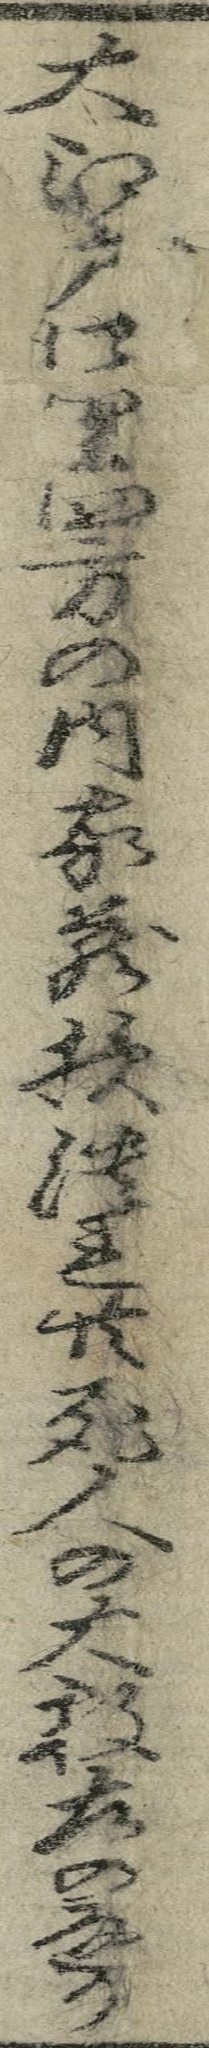大江戸四里四方の内家蔵損潰れ共死人の大数左の通り
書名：江戸　大地震末代噺の種　全
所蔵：東京大学地震研究所図書室 Earthquake Research Institute Library, The University of Tokyo, JAPAN
